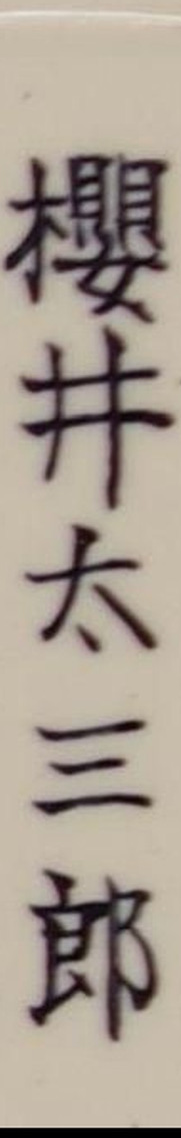櫻井太三郎
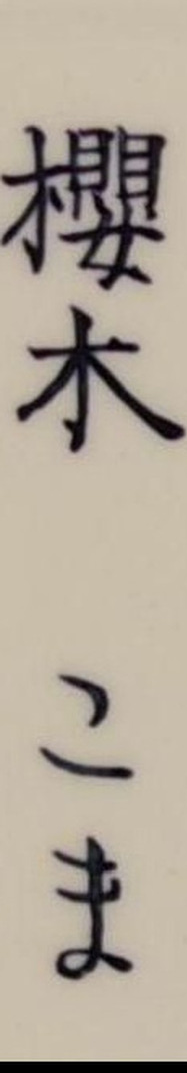桜木こま
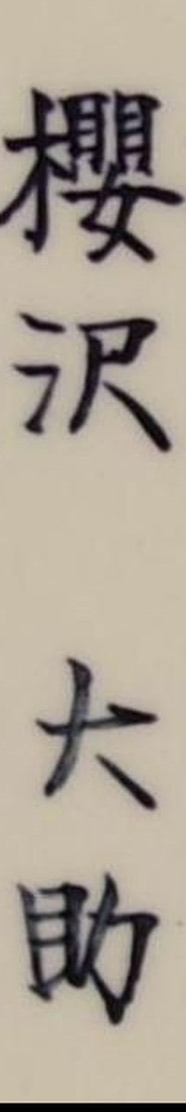桜沢大助
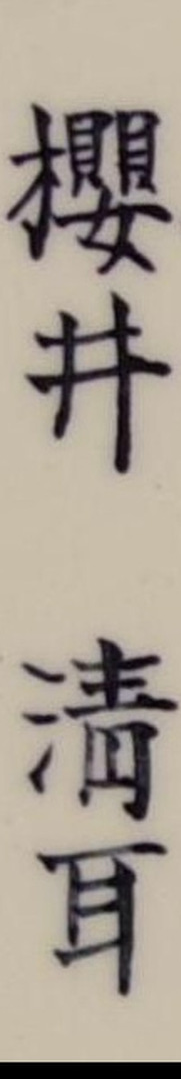桜井清耳
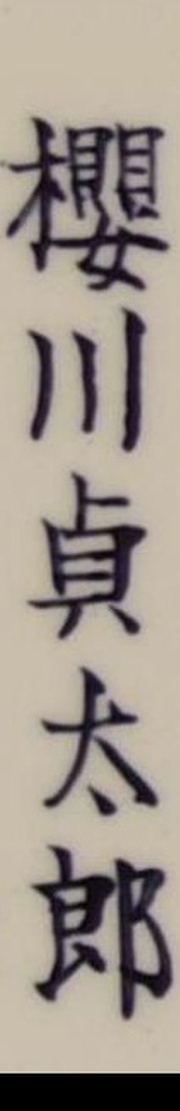桜川貞太郎
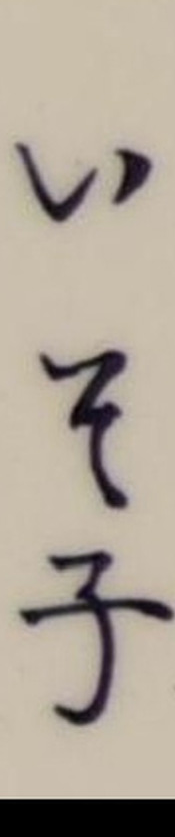いそ子
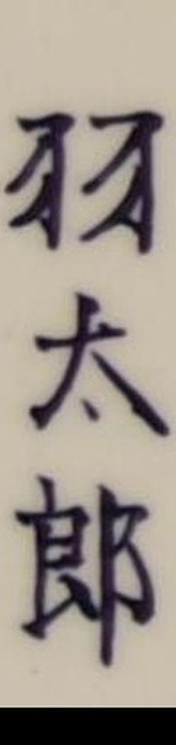羽太郎
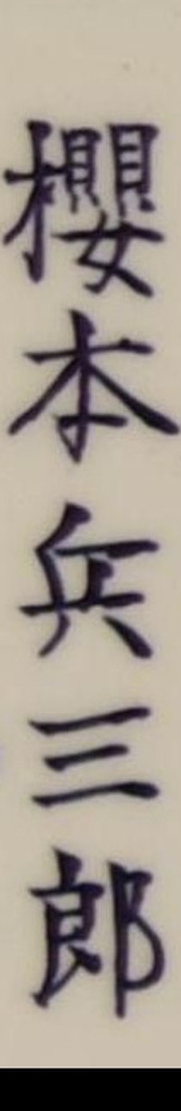桜本兵三郎

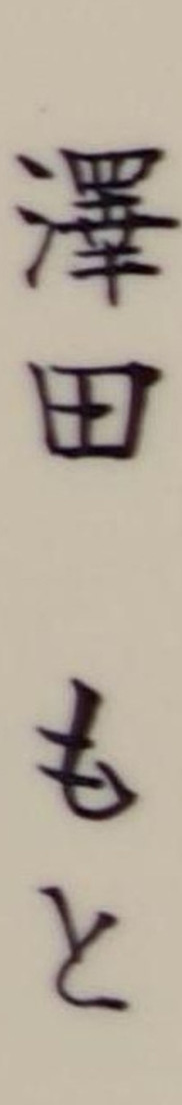澤田もと
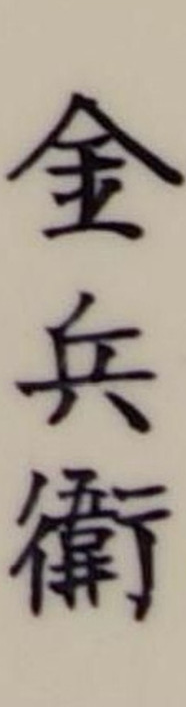金兵衛
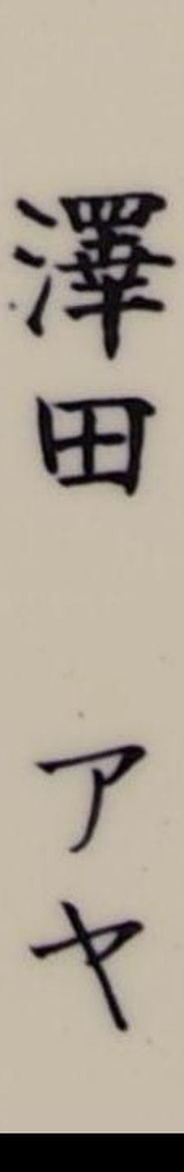澤田アヤ
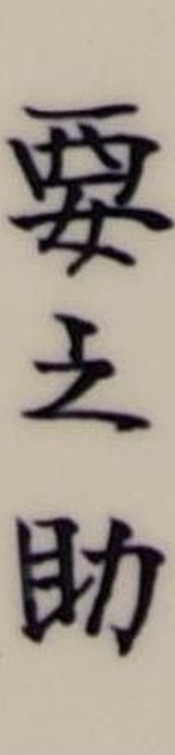要之助
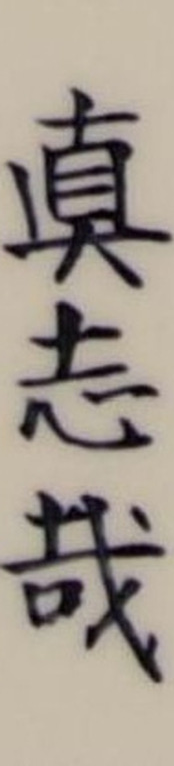真志哉
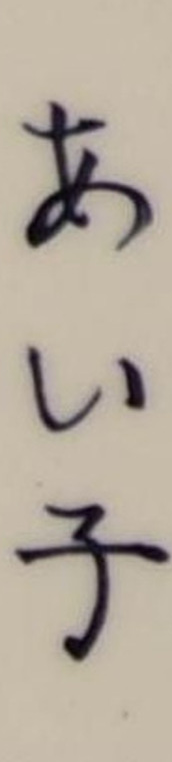あい子

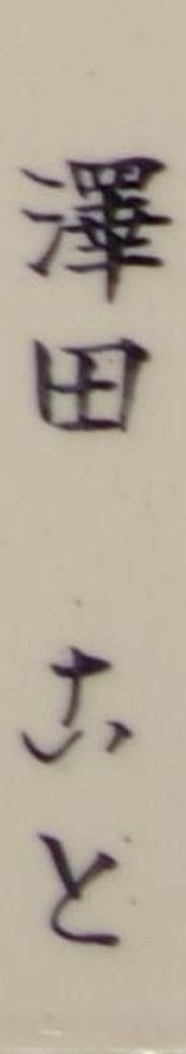澤田こと
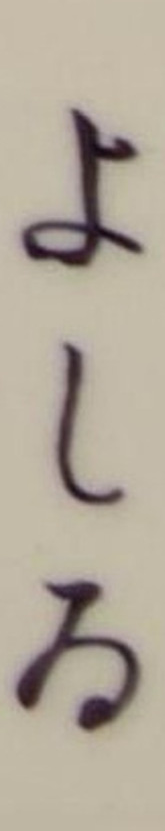よしる
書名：E~L
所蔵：高野山金剛峯寺
